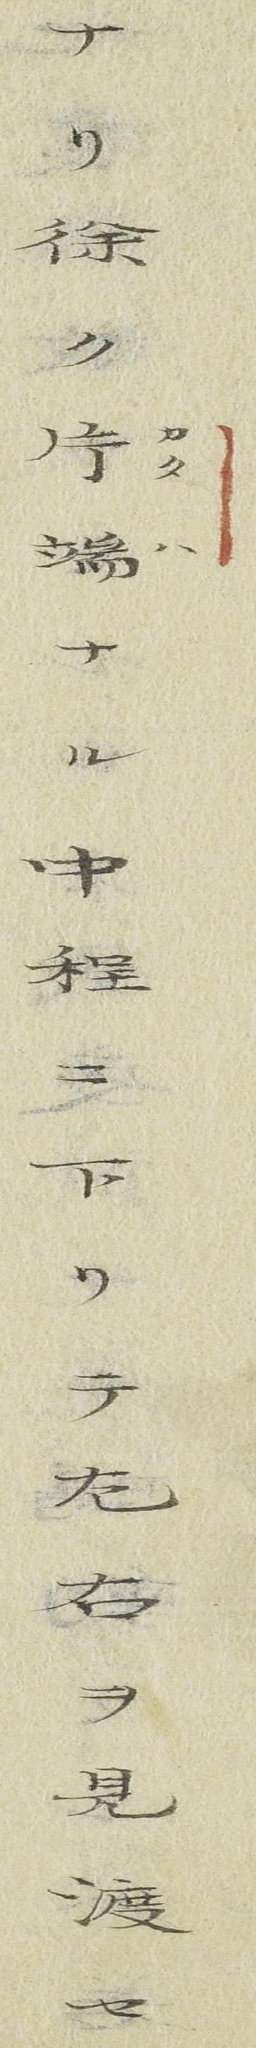ナリ徐ク片端ナル中程ニ下リテ左右ヲ見渡セ
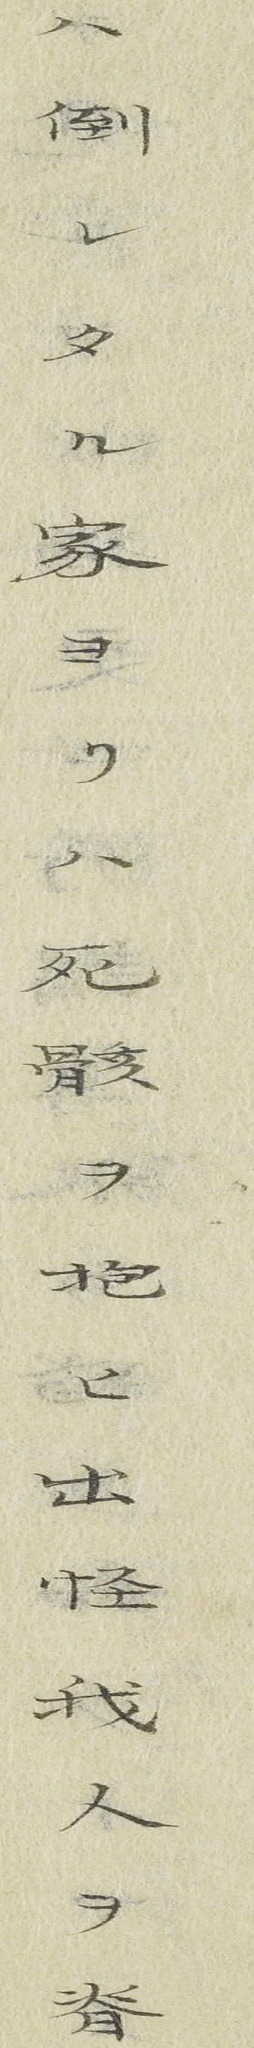ハ倒レタル家ヨリハ死骸ヲ抱ヒ出怪我人ヲ脊
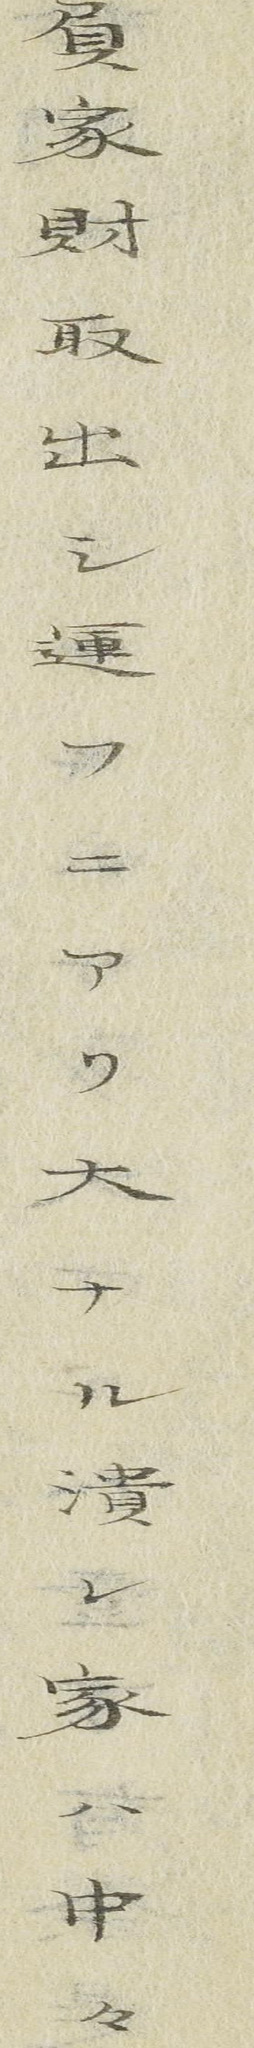負家財取出シ運フニアリ大ナル潰レ家ハ中々
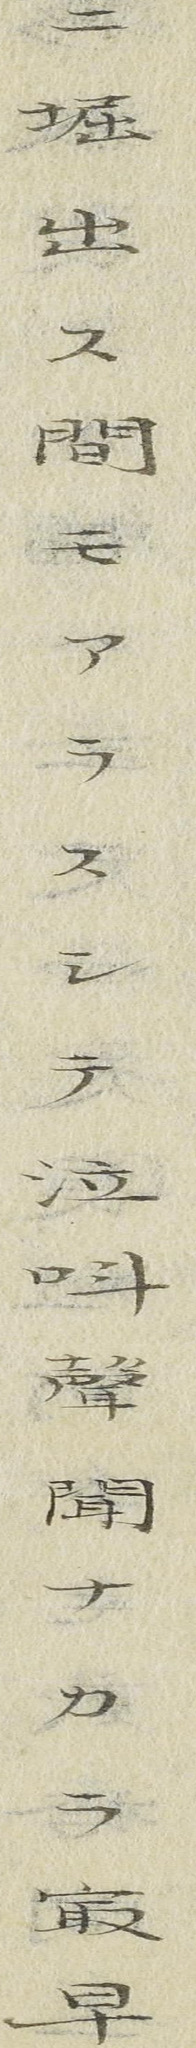ニ掘出ス間モアラスシテ泣叫声聞ナカラ最早
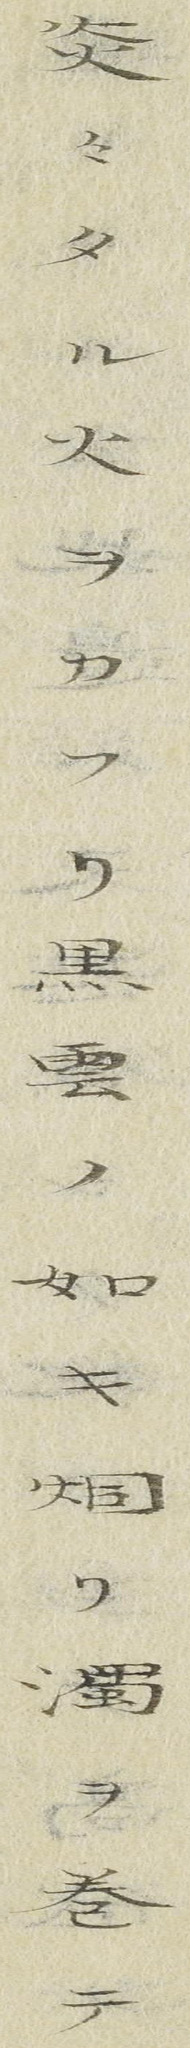炎々タル火ヲカフリ黒雲ノ如キ烟リ濁ヲ巻テ
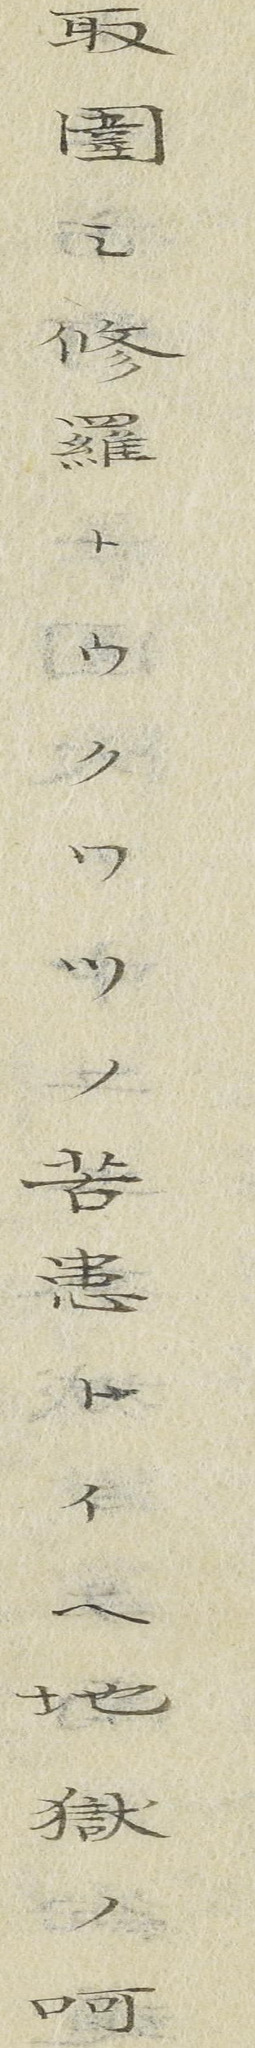取囲ミ修羅トウクワツノ苦患トイヘ地獄ノ呵
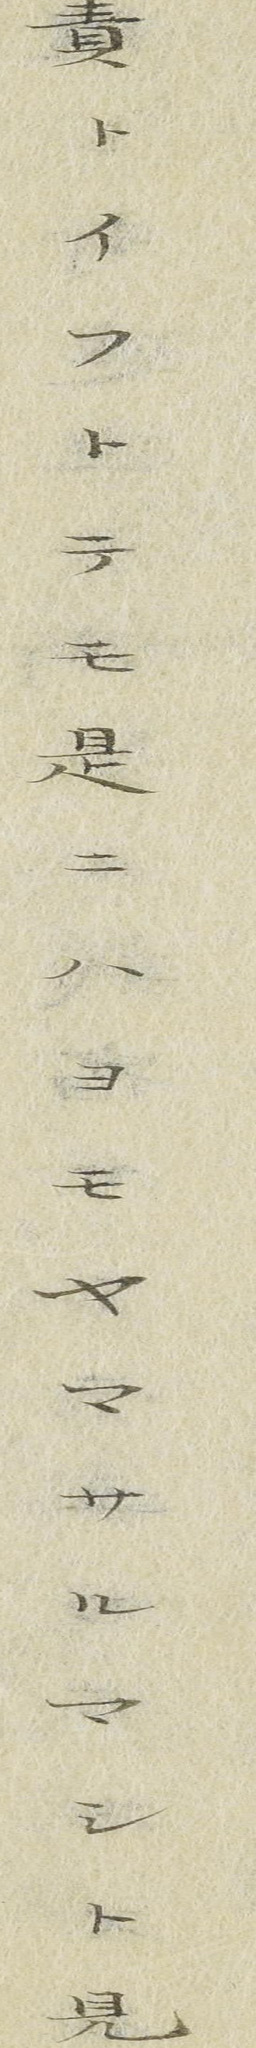責トイフトテモ是ニハヨモヤマサルマシト見
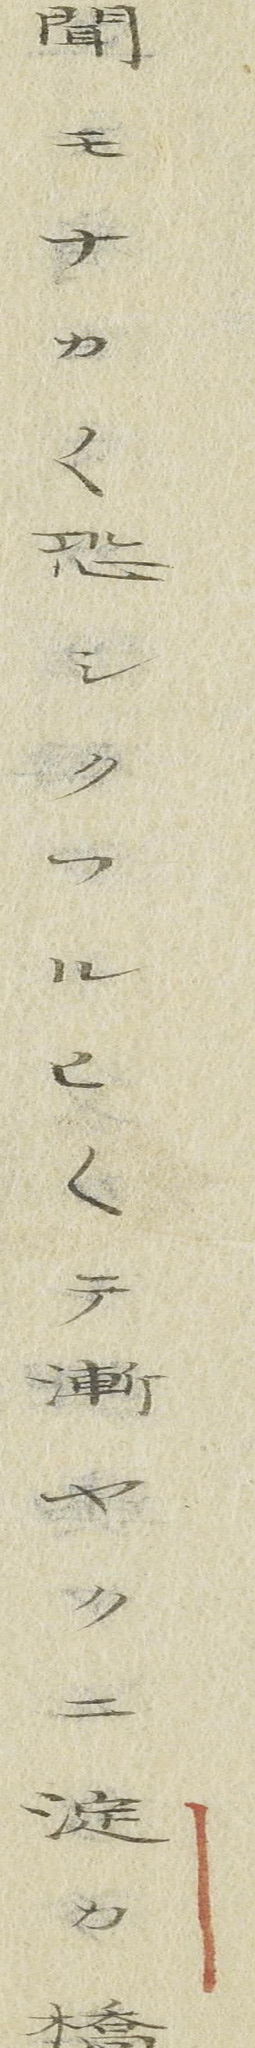聞モナカ〱恐シクフルヒ〱テ漸ヤクニ淀カ橋
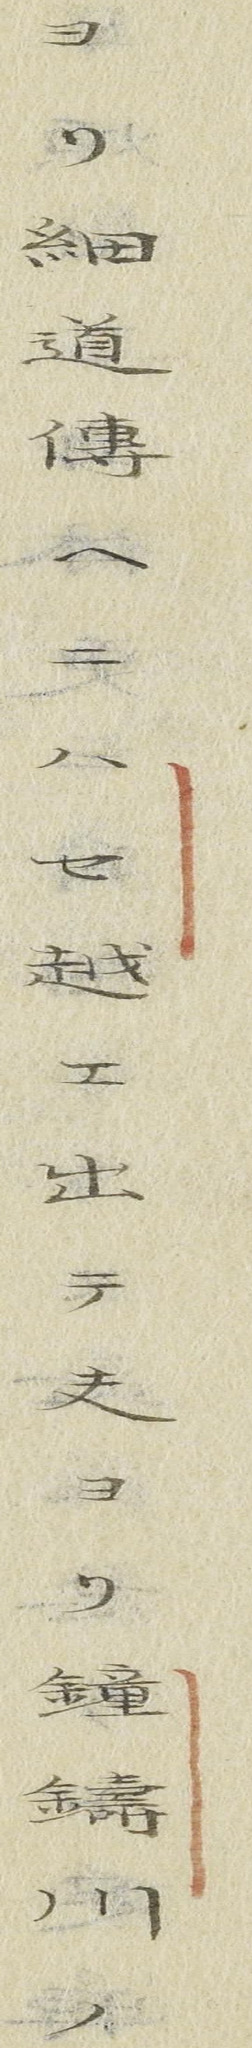ヨリ細道伝ヘニハセ越エ出テ夫ヨリ鐘鋳川ノ
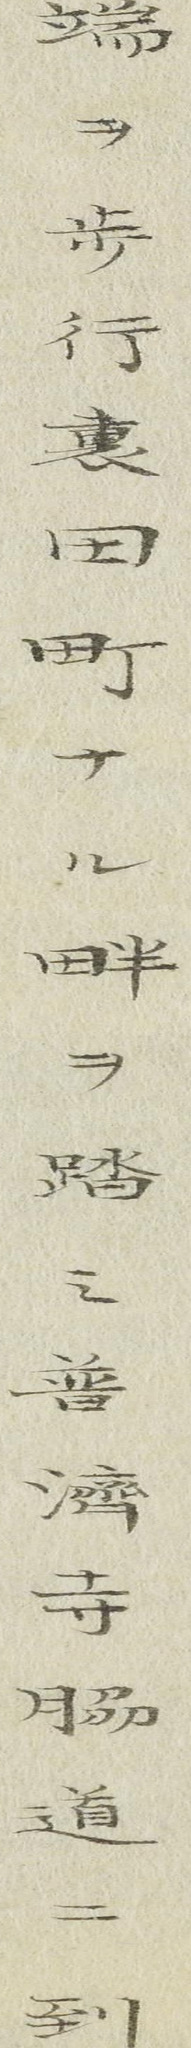端ヲ歩行裏田町ナル畔ヲ踏ミ普済寺脇道ニ到
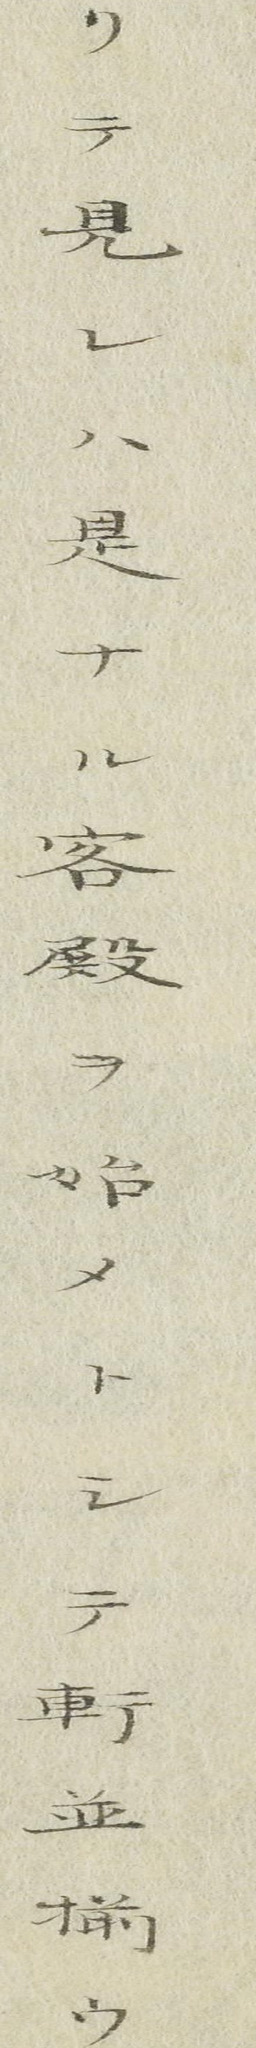リテ見レハ是ナル客殿ヲ始メトシテ軒並揃ウ
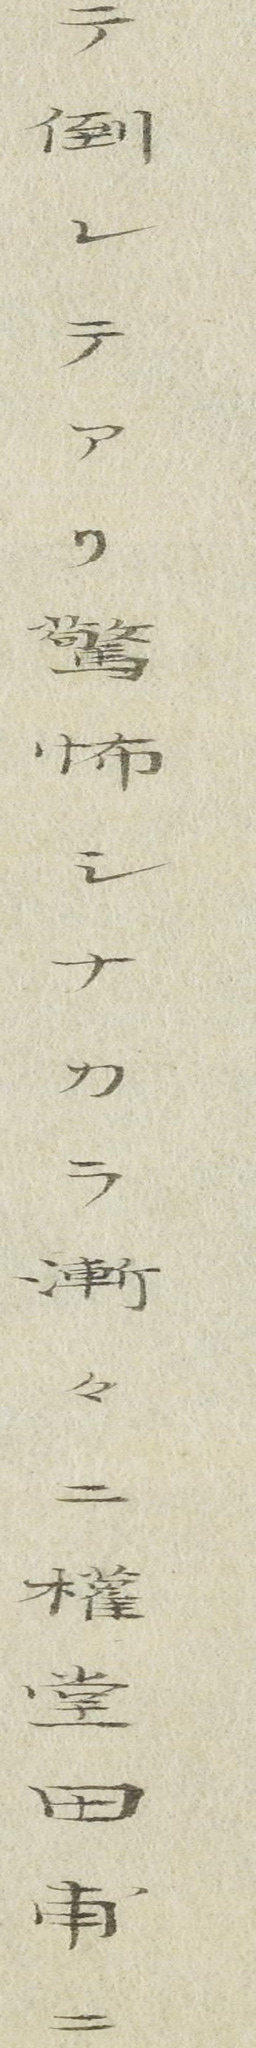テ倒レテアリ驚怖シナカラ漸々ニ権堂田甫ニ
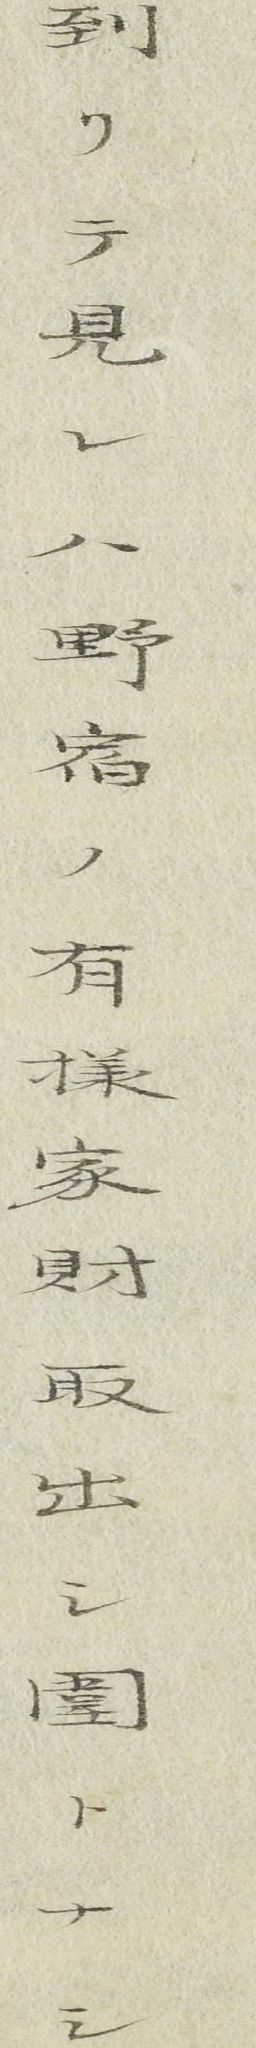残リテ見レハ野宿ノ有様家財取出シ囲トナシ
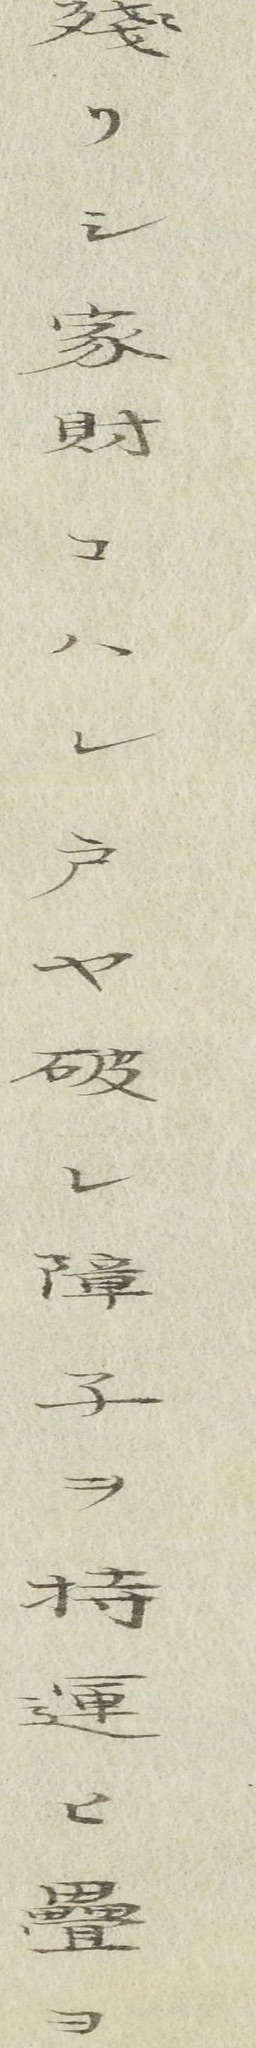残リシ家財コハレ戸ヤ破レ障子ヲ持運ヒ畳ヨ
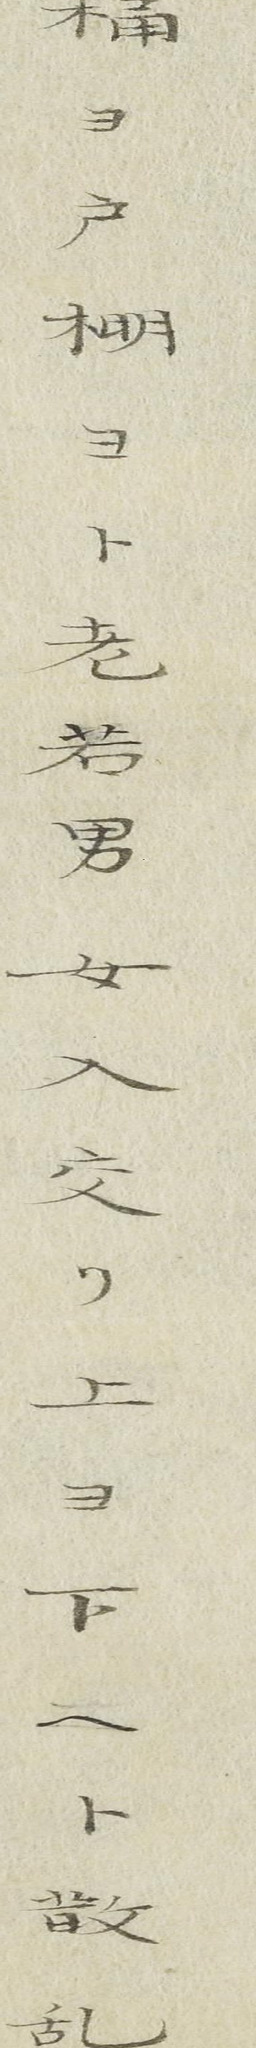桶ヨ戸棚ヨト老若男女入交リ上ヨ下ヘト散乱
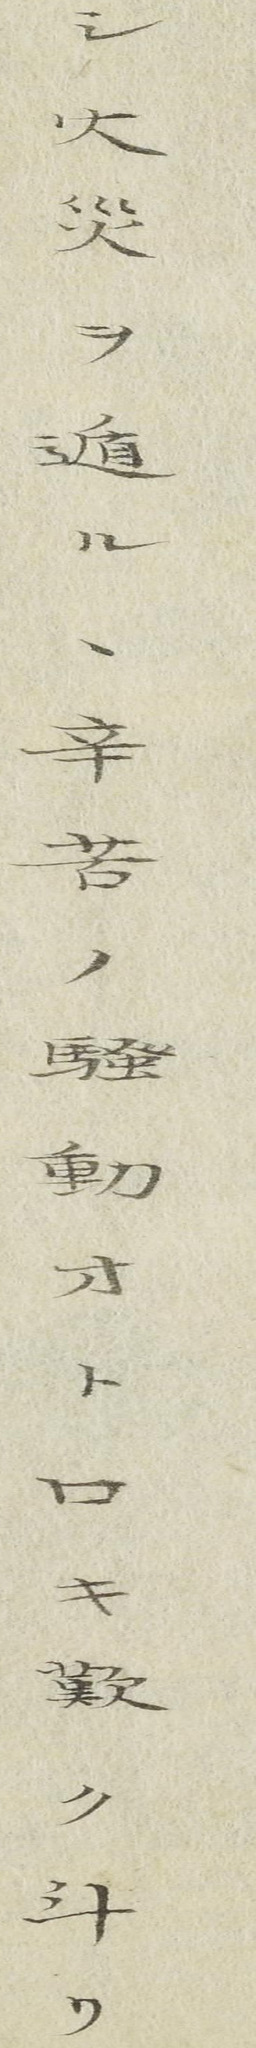シ火災ヲ遁ルヽ辛苦ノ騒動オトロキ歎ク斗リ
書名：地災撮要　地震之部　巻ノ二
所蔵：東京大学地震研究所図書室 Earthquake Research Institute Library, The University of Tokyo, JAPAN
